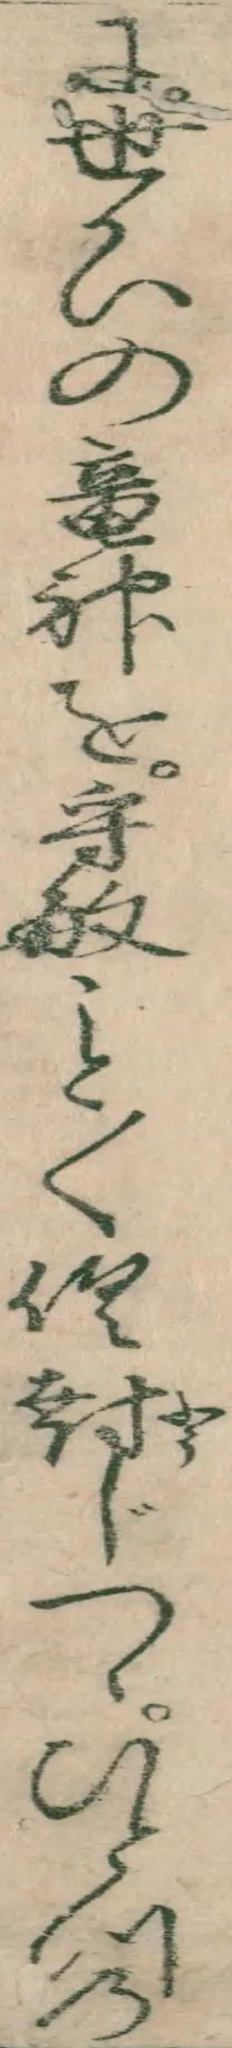に。せかいの竜神を。守敏こと〳〵く封じつゝ。ひとつの
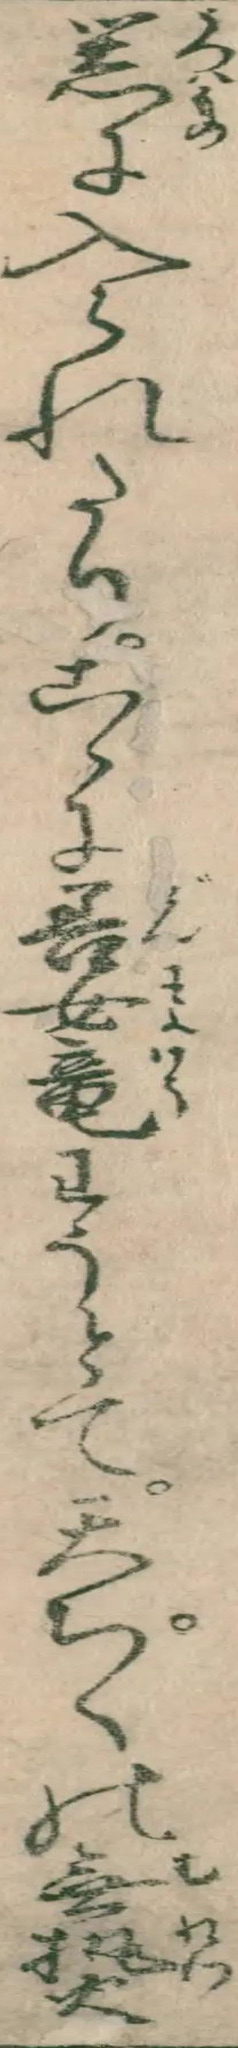器に入られたり。こゝに善女竜わうとて。天ぢくの無熱
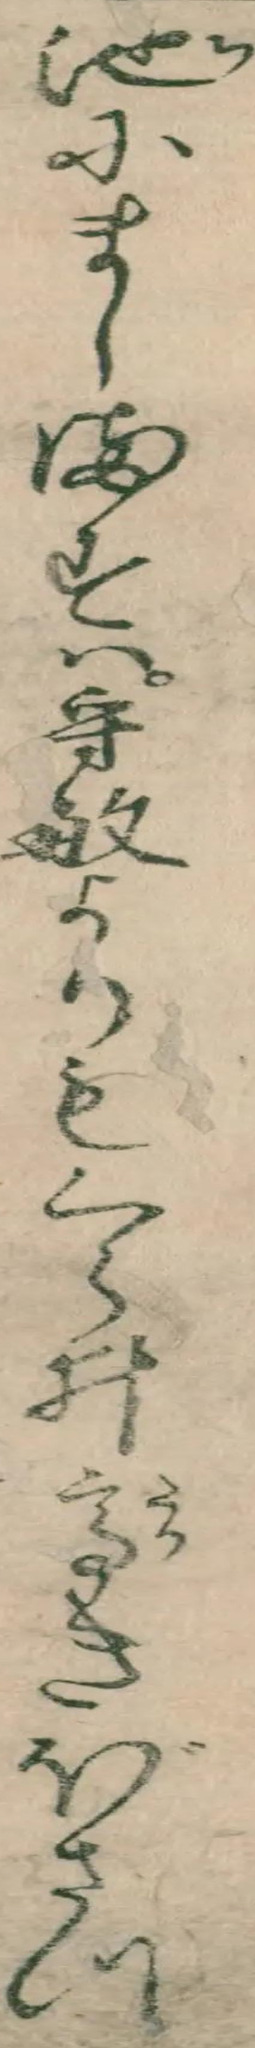池にましますは。守敏よりもくらゐ高きぼさつ
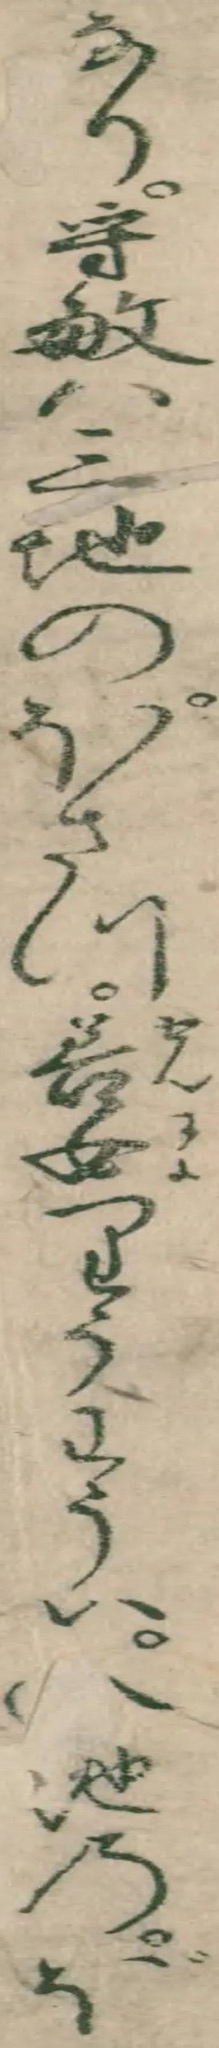なり。守敏は三地のぼさつ。善女りうわうは。池の。ぼ

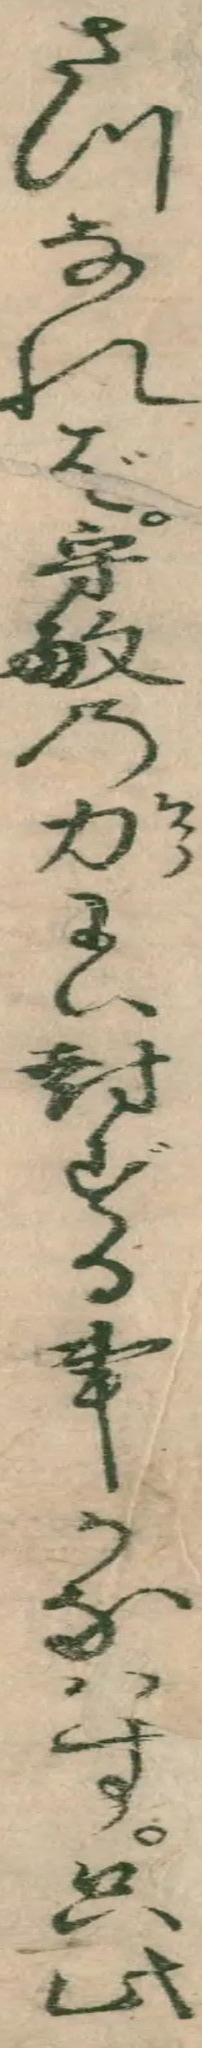さつなれば。守敏の力には封ずる事かなはす。只此
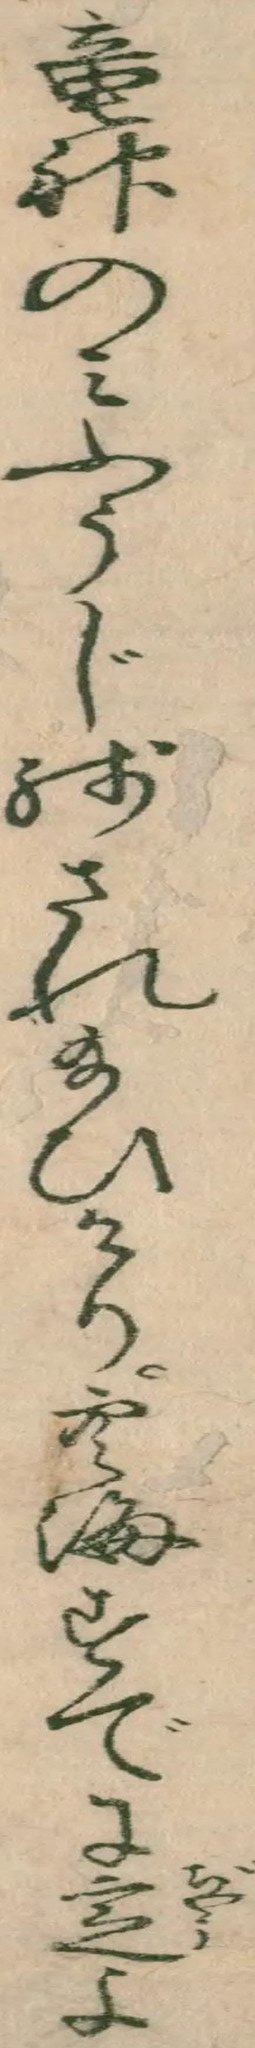竜神のみふうじ残され給ひけり。空海すでに定よ
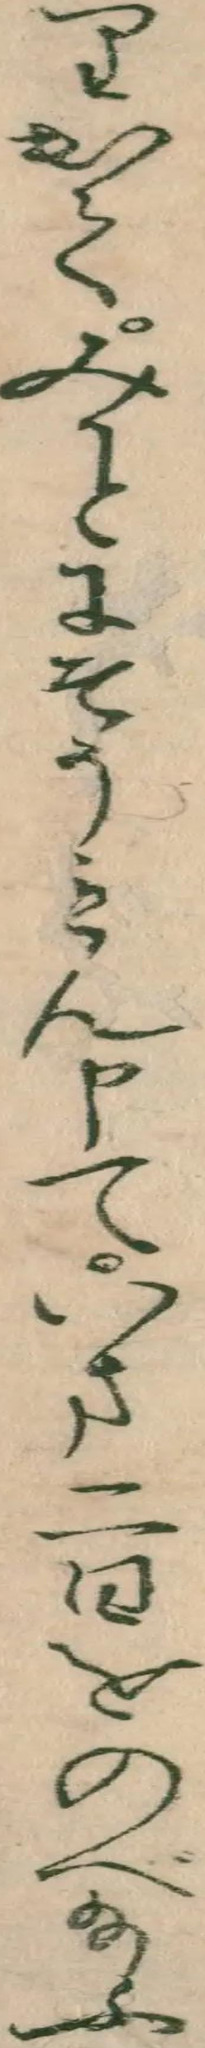り出て。みことにそうもん申て。いま二日をのべ給ふ
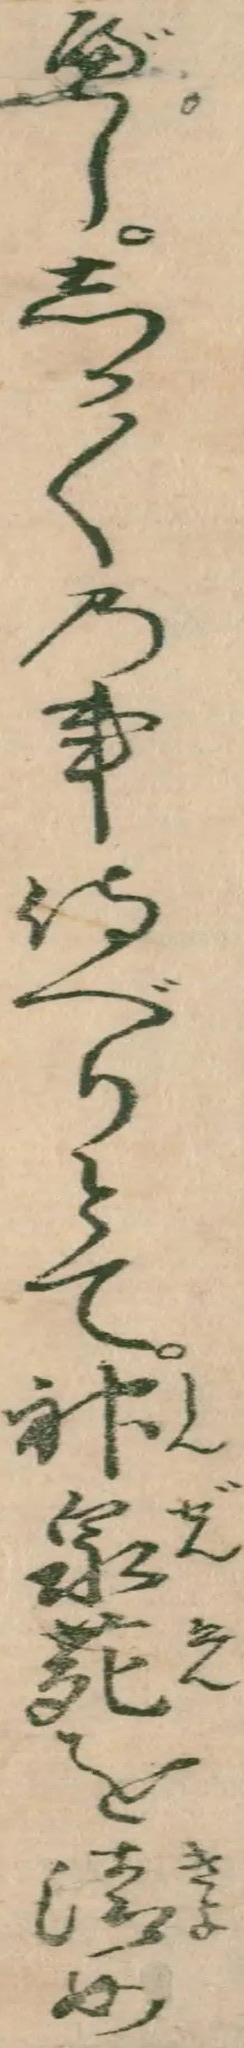べし。しか〳〵の事侍べりとて。神泉苑を清め
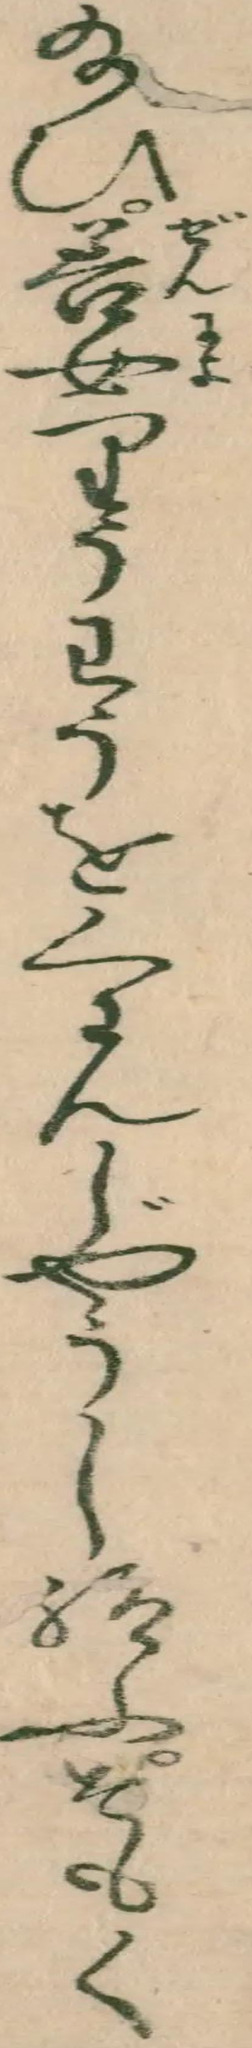給ひ。善女りうわうをくわんじやうし給ふ。そも〳〵
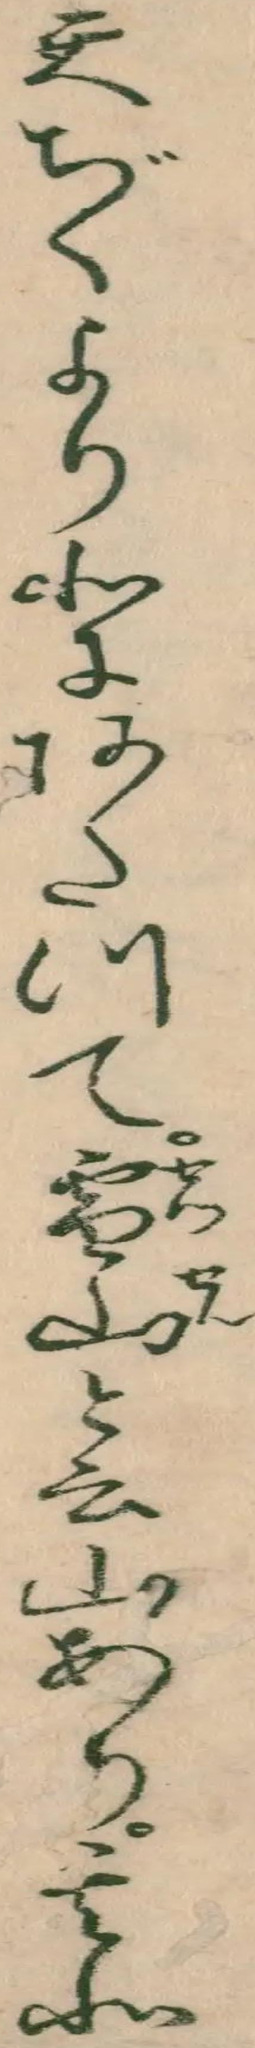天ぢくより北にあたつて。雪山と云山あり。其北
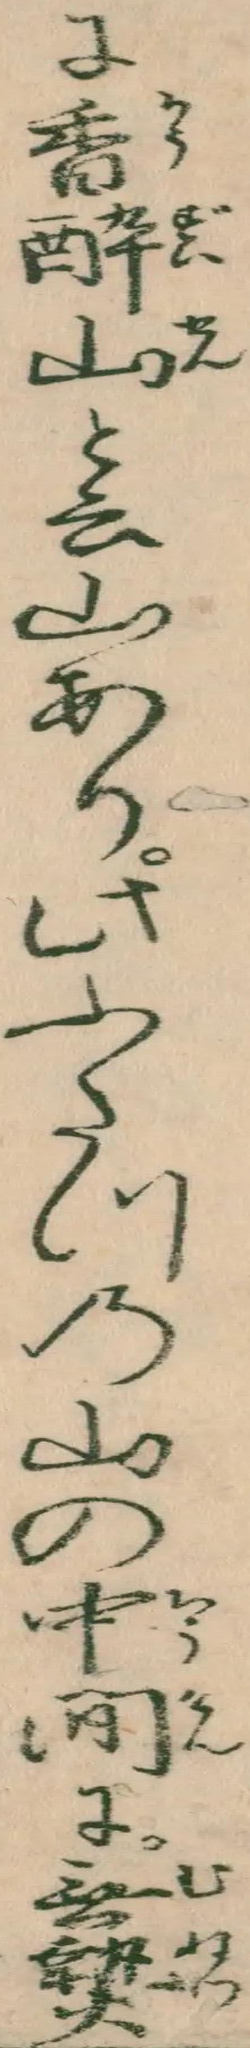に香酔山と云山あり。其ふたつの山の中間に無熱
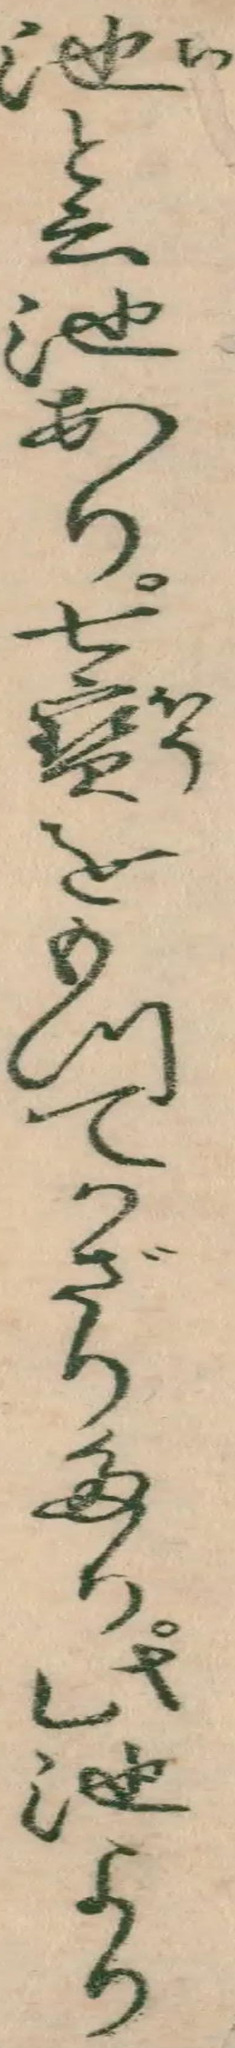池と云池あり。七宝をもつてかざりたり。此池より
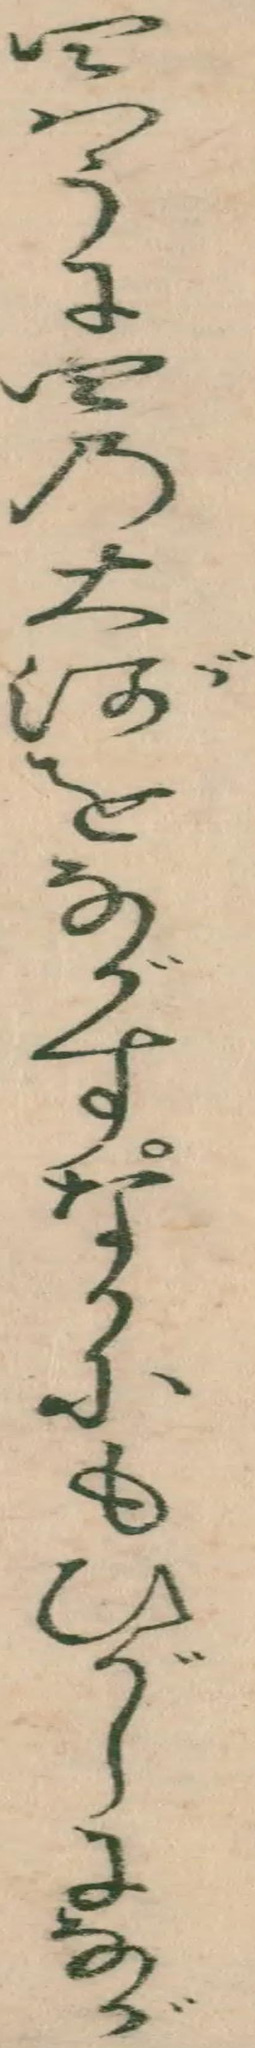四はうに四の大河をながす。なかにもひがしになが
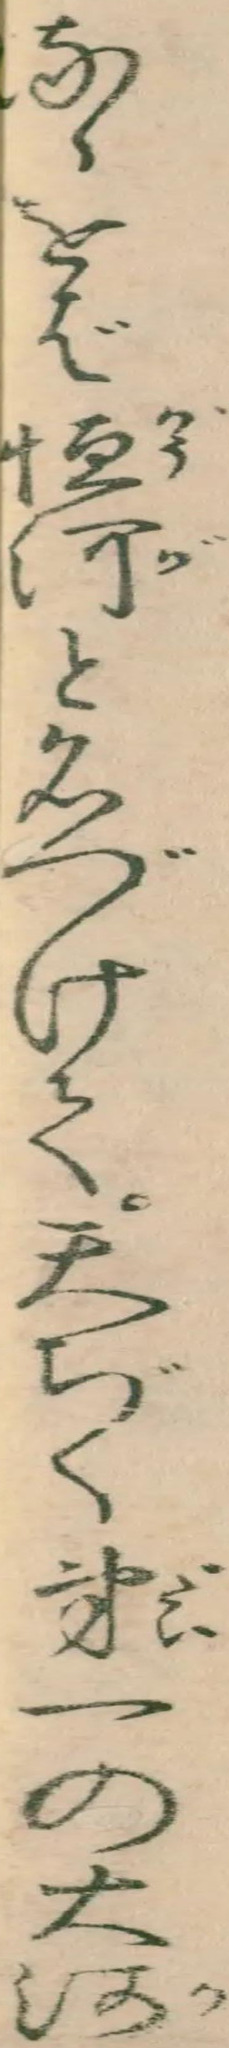るゝをば恒河と名づけて。天ぢく第一の大河
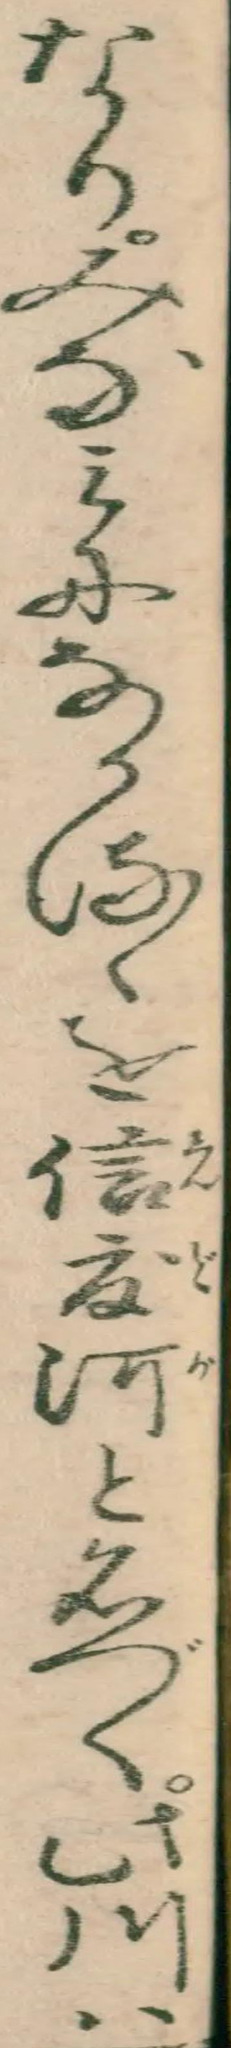なり。みなみななかるゝを信度河と名づく。此川は
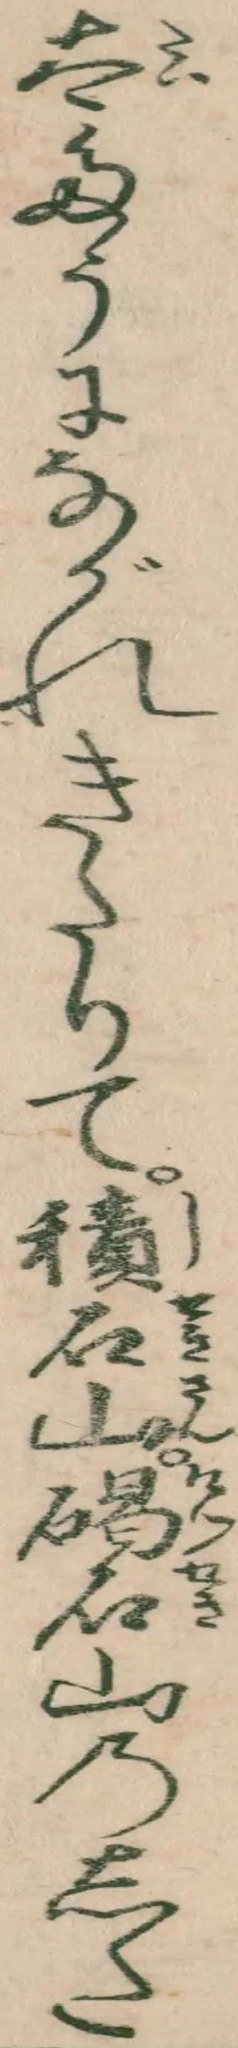太たうにながれきたりて。積石山。碣石山のした
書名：弘法大師御本地 3巻. [2]
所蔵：国立国会図書館 National Diet Library, JAPAN
